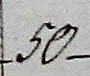50
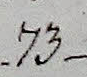73
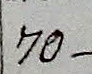70
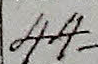44
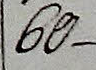60
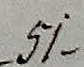51
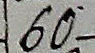60
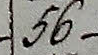56
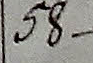58
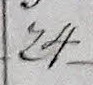24
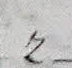2
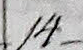14
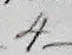4
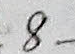8
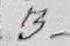3
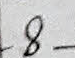5
